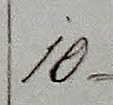10
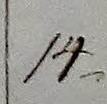14
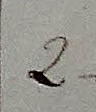2
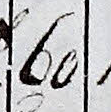60
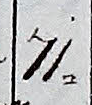71
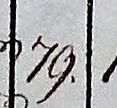79.
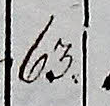63.
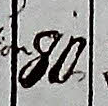80
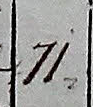71
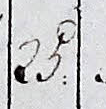25:
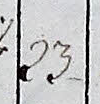23
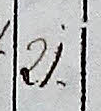21.
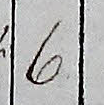6
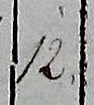12
